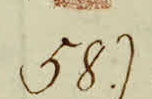58.
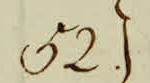52.
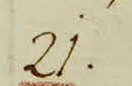21.
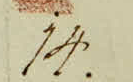14.
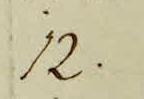12.
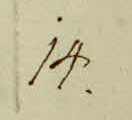14.
